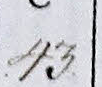43
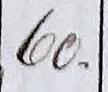60
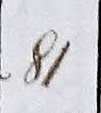81
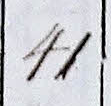41
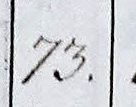73.
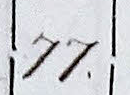77.
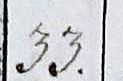33.
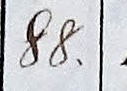88.
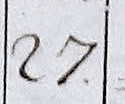27.
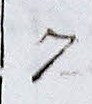7
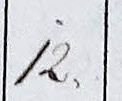12.
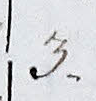3
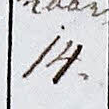14
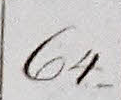64
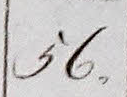56
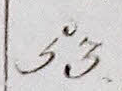53
